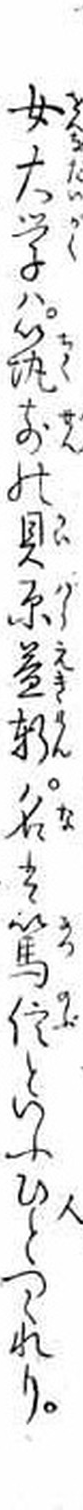女大学は。筑前の貝原益軒。名は篤信といふひとつくれり。
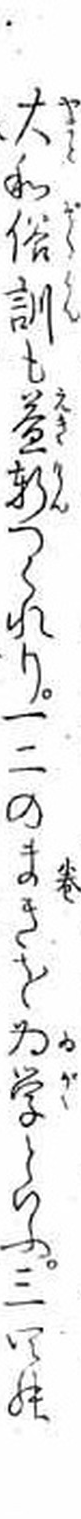大和俗訓も益軒つくれり。一ニのまきを為学といふ。三四の
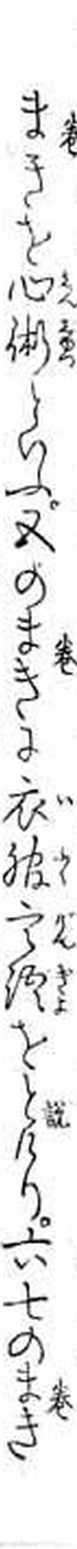まきを心術といふ。五のまきに衣服言語をとけり。六七のまき
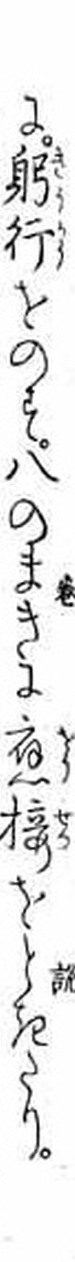に。躬行をのす。八のまきに応接をとき
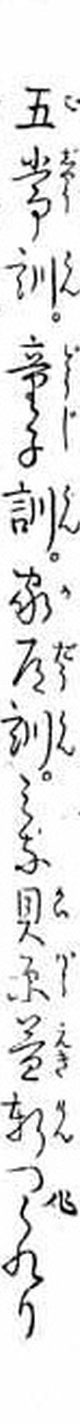五常訓。童子訓。家道訓。みな貝原益軒つくれり
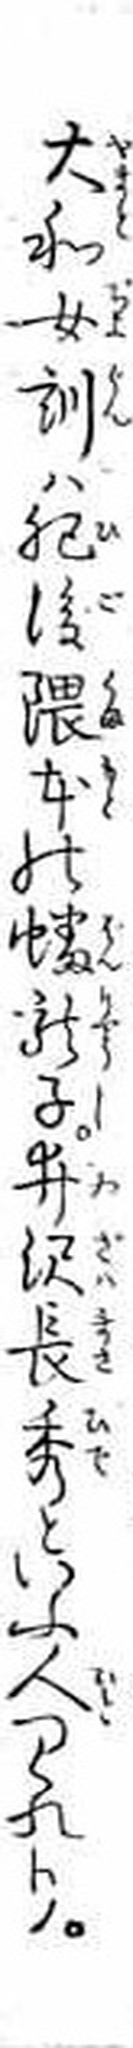大和女訓は肥後隈本の幡龍子。井沢長秀といふ人つくれり。
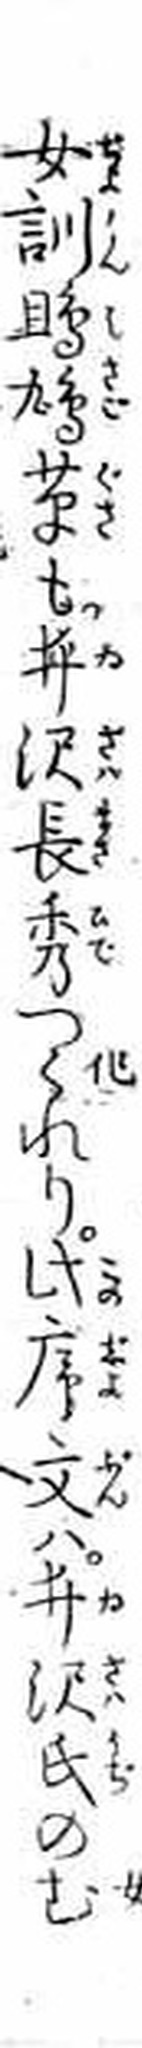女訓雎鳩草も。井沢長秀つくれり。此序文は。井沢氏のむ
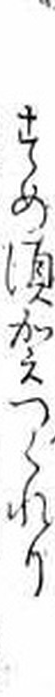すめ須賀つくれり。
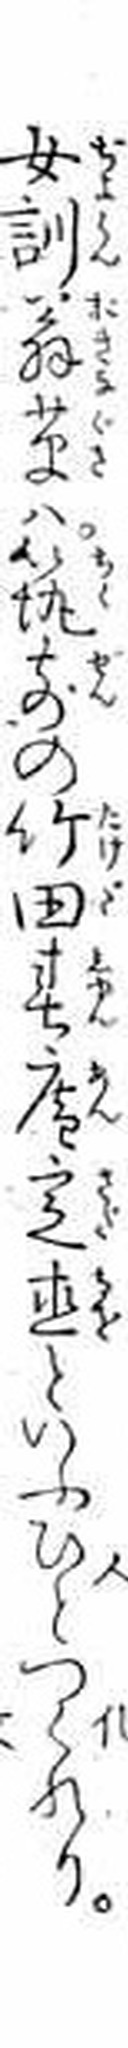女訓翁草は。筑前の竹田春庵定直といふひとつくれり。
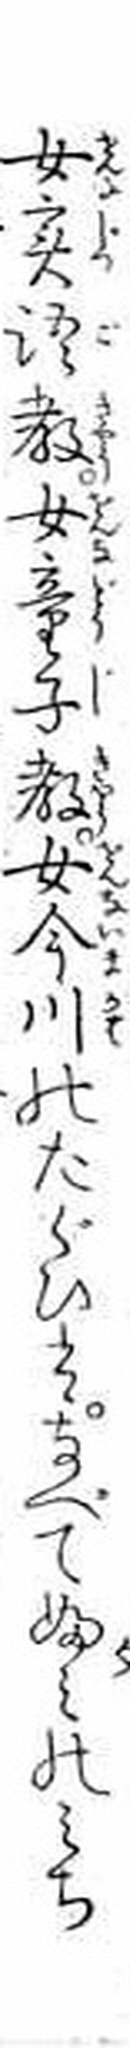女実語教。女童子教。女今川のたぐひは。なべてふみのみち
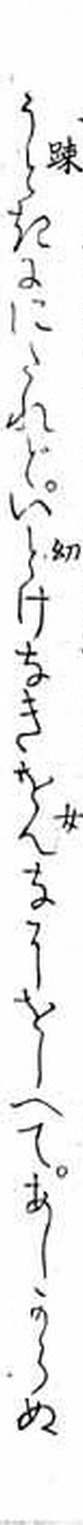うときにたれど。いとけなきをんなにをしへて。あしからぬ
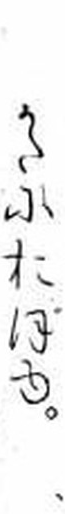かたにおぼゆ。
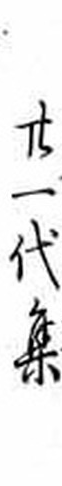廿一代集
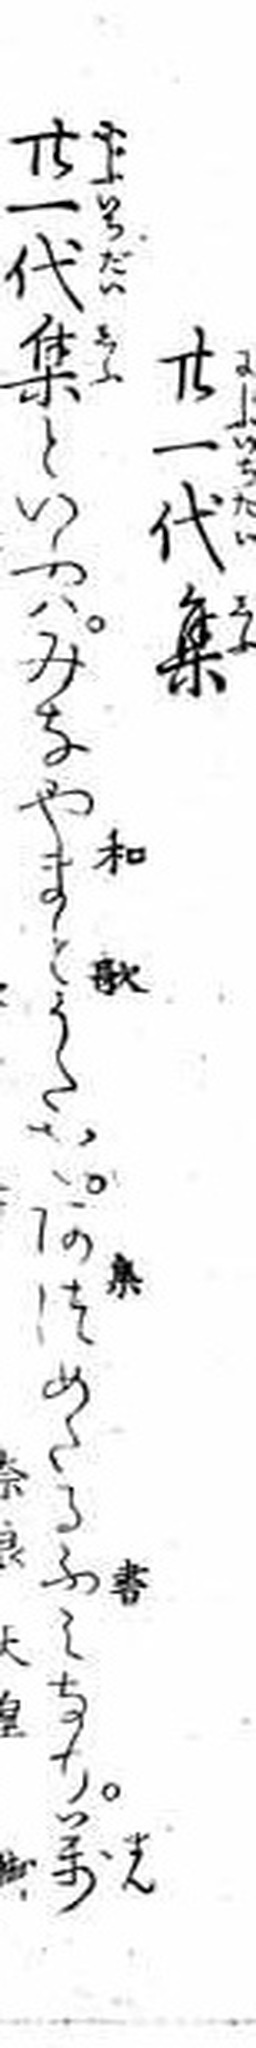廿一代集といふは。みなやまとうたを。あつめたるふみなり。万
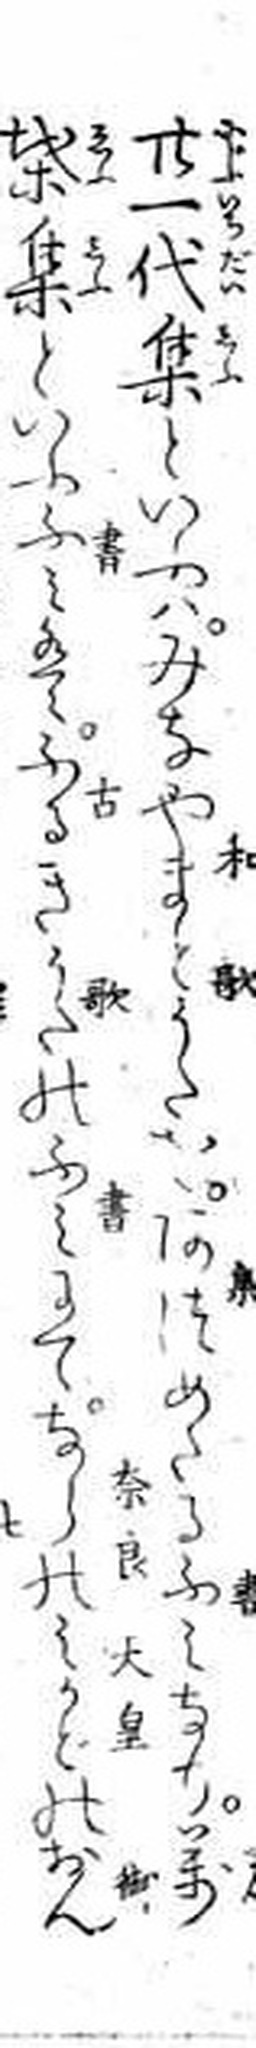葉集といふふみは。ふるきうたのふみにて。ならのみかどのおん
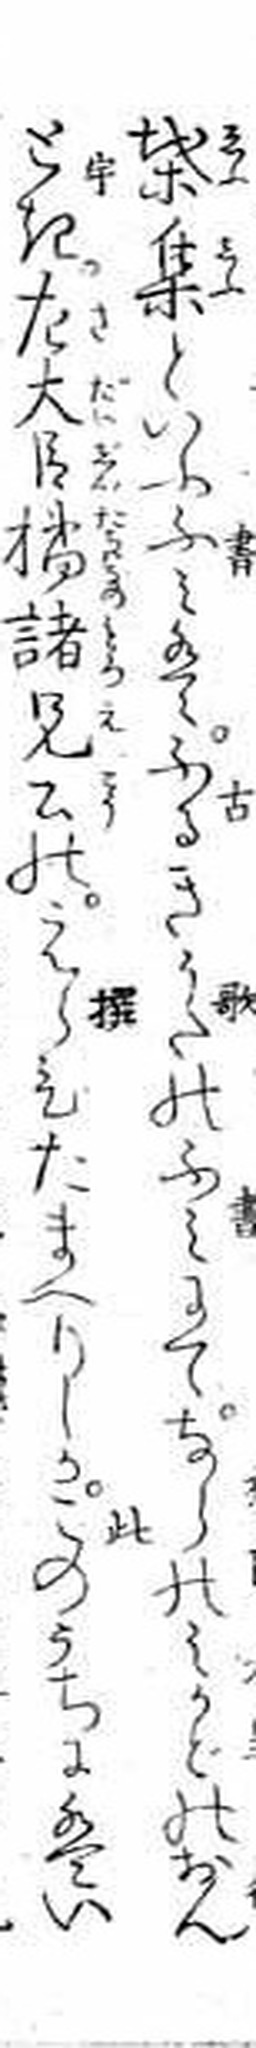とき。左大臣橘諸兄公の。えらひたまへりしか。このうちにはい
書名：女学範
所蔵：東京学芸大学教育コンテンツアーカイブ
